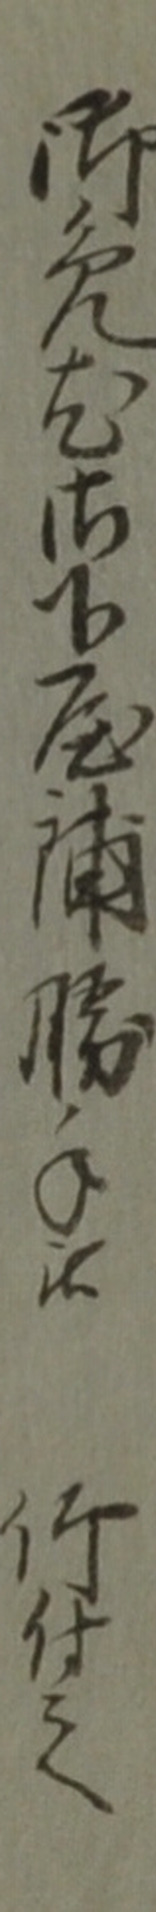御免尤御下屋鋪勝手被仰付之
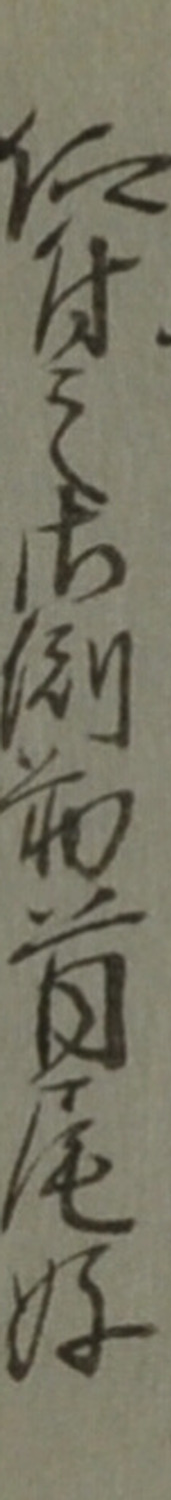仰付之御側勤首尾好
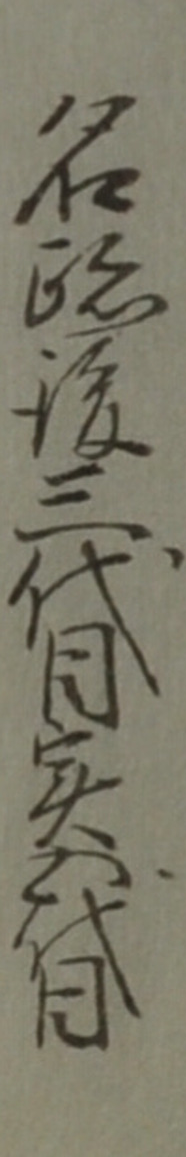名跡後三代目実五代目
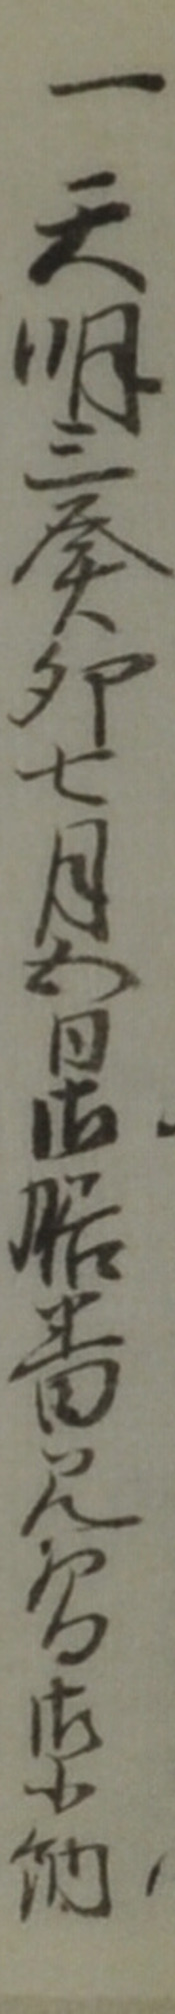一天明三癸卯七月五日御膳番見習御小納
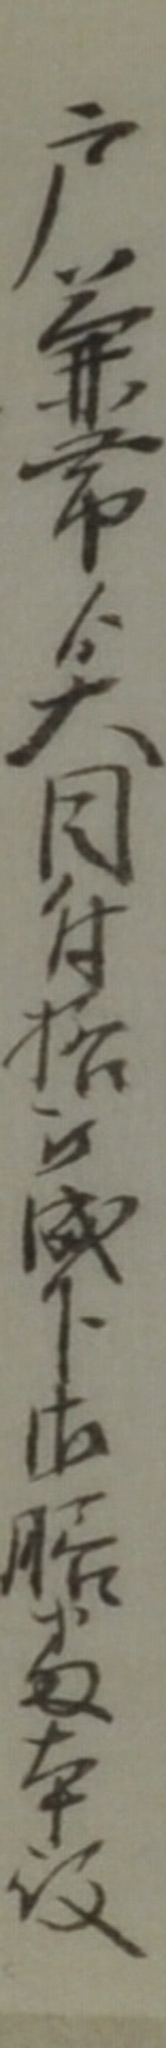戸兼帯ゟ大目付格被成下御膳番本役
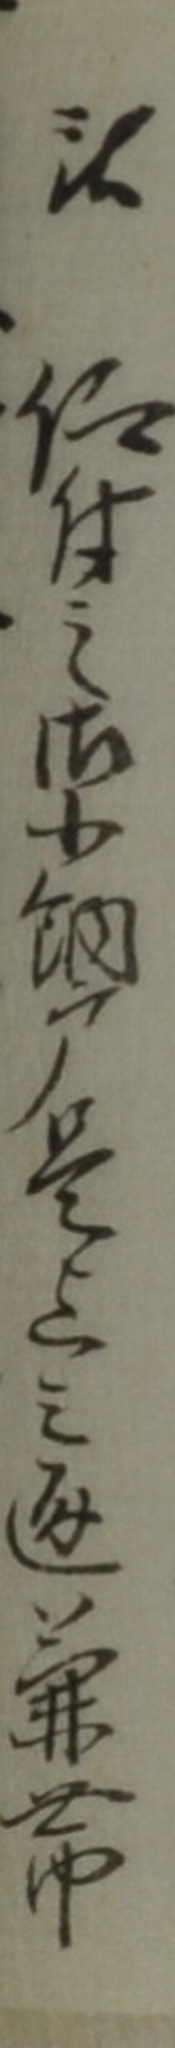被仰付之御小納戸是迄之通兼帯
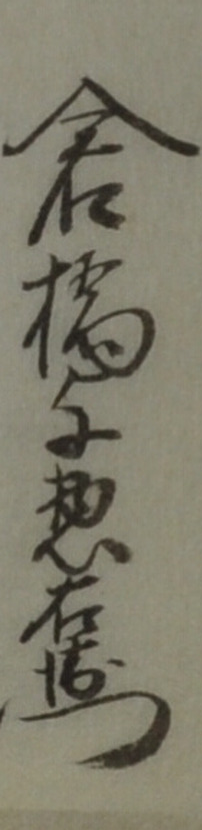倉橋与惣右衛門
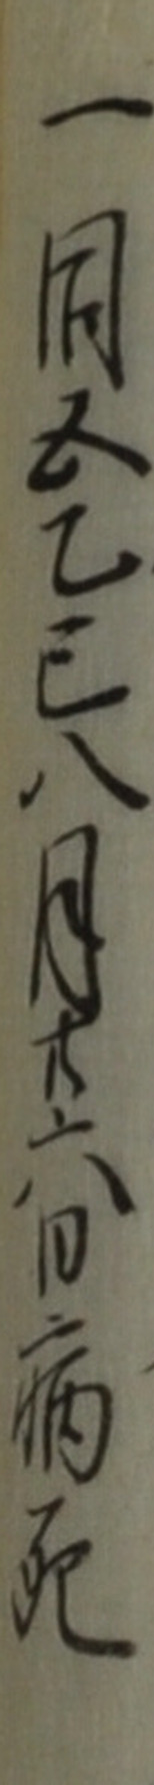一同五乙巳八月廿六日病死
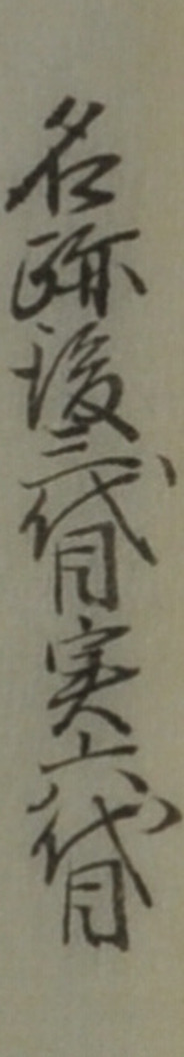名跡後三代目実六代目
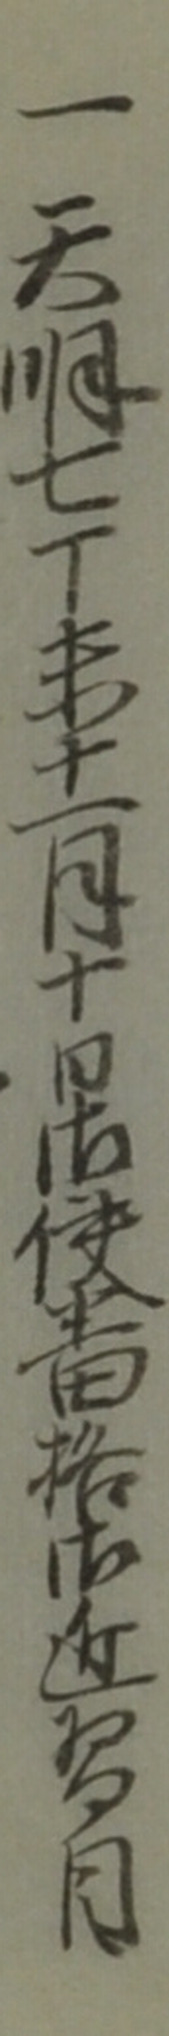一天明七丁未十一月十日御使番格御近習目
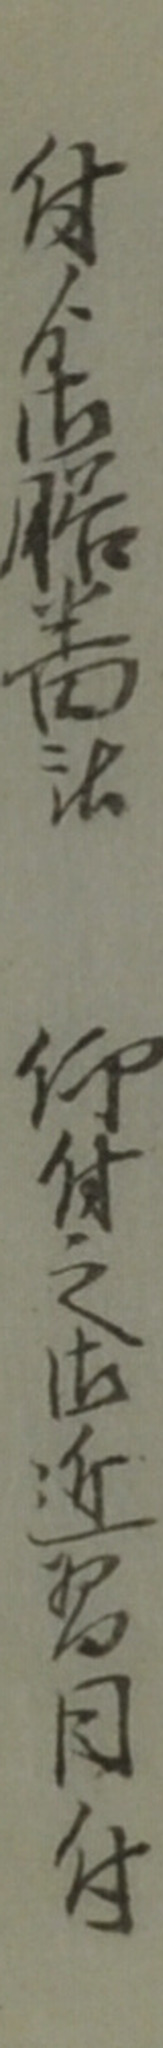付ゟ御膳被仰付之御近習目付
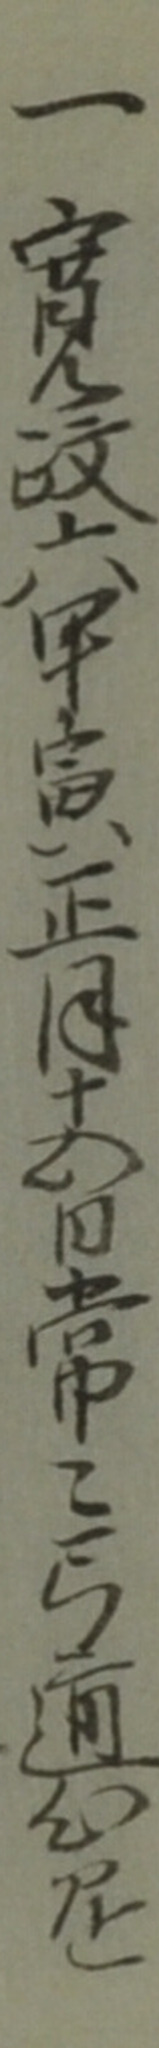一寛政六甲寅正月十五日常々弓道心懸
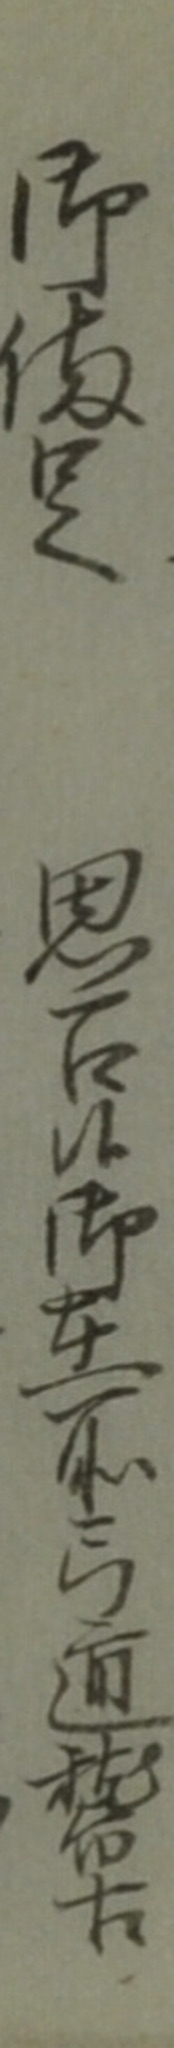御満足思召候御在所弓道稽古
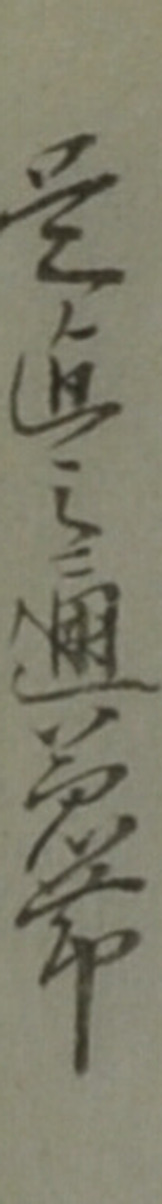是迄之通兼帯
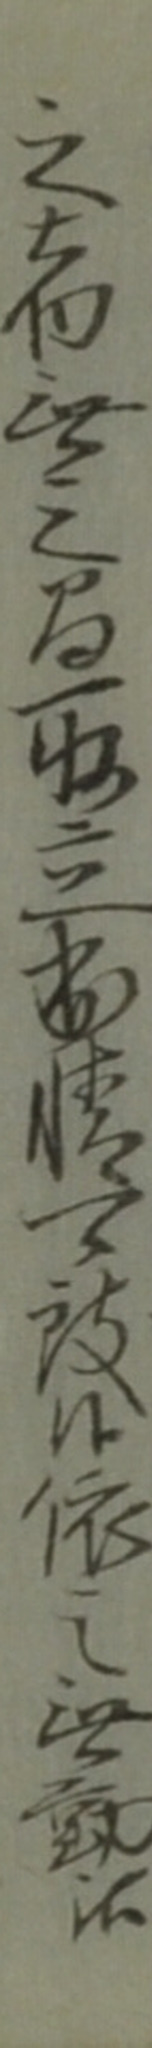之物無之間取立出情可致候依之無勤被
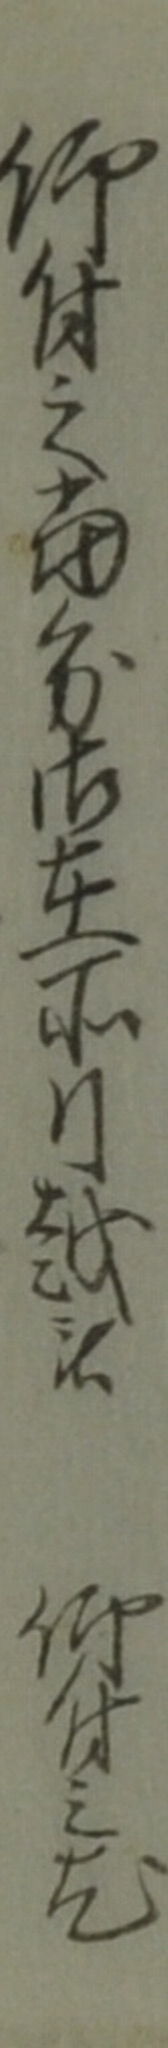仰付之当分御在所引越被仰付之尤
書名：諸御役代々録（四）
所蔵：伊那市立高遠町図書館・合同会社AMANE
